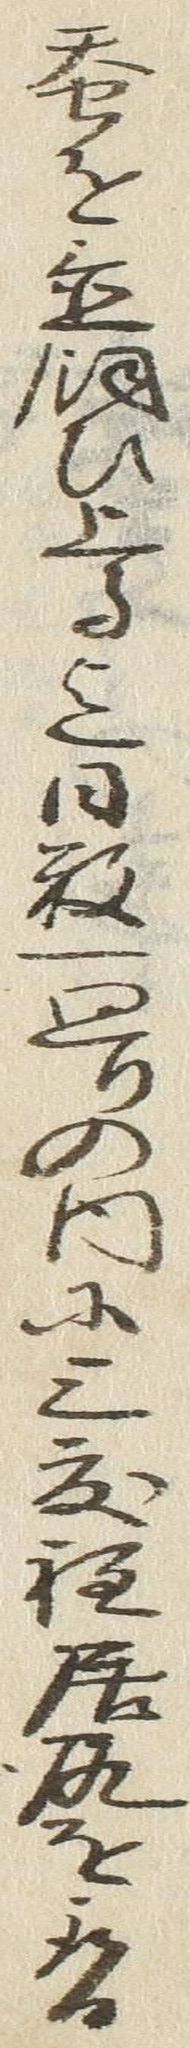蚕を置飼ひ上る迄日数一廻りの内尓三度程居尻を取る
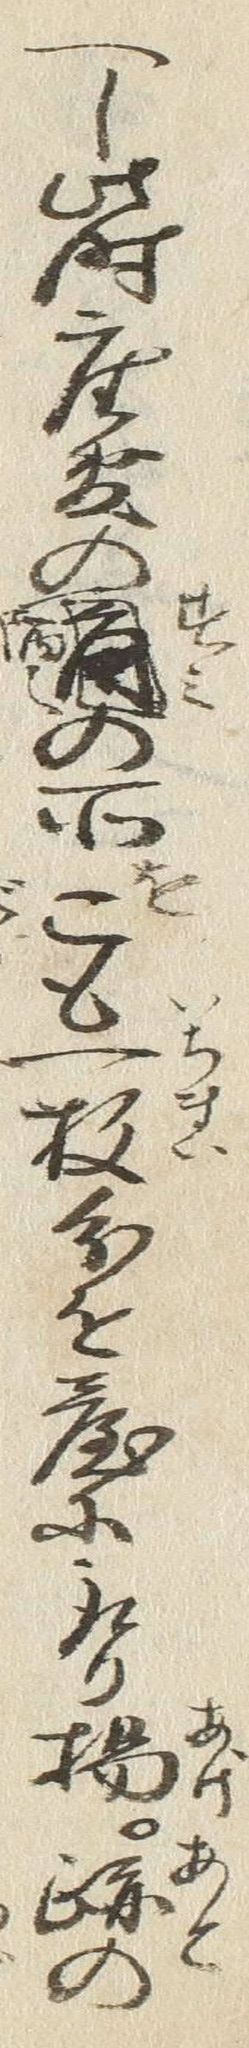へし此時座敷の隅の所をこも一枚分を臺尓取揚。跡の
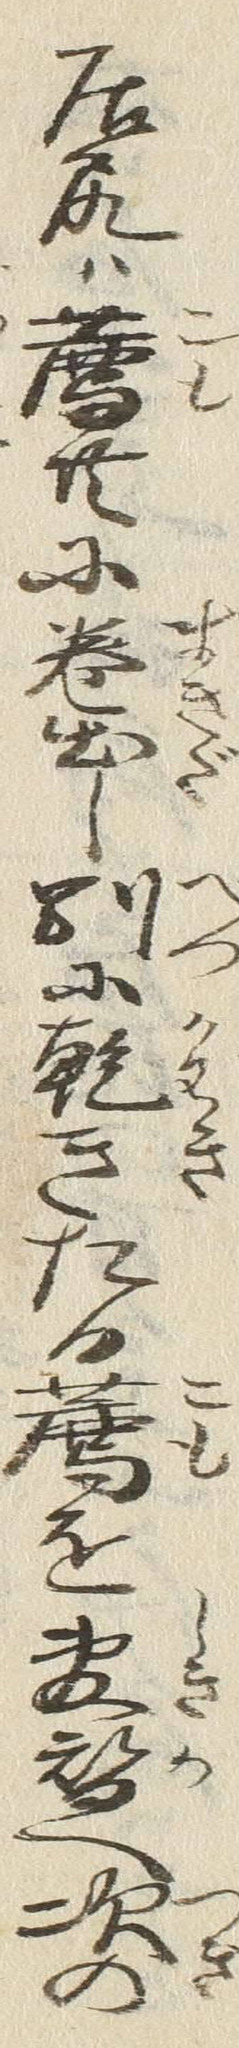居尻は薦共尓巻出し別尓乾きたる薦を敷替へ次の
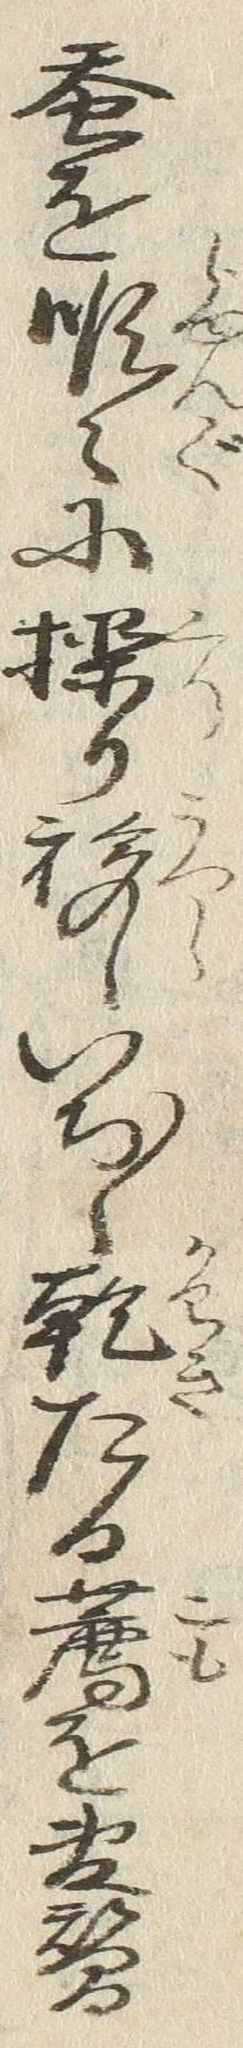蚕を順々尓操り移しいち〳〵乾たる薦を敷替る
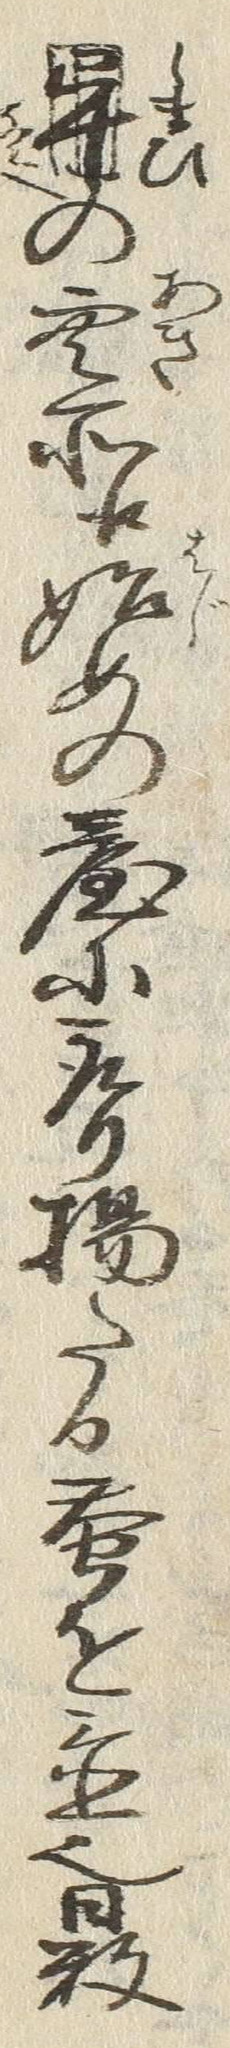終の空所江始めの臺尓揚たる蚕を置也日数
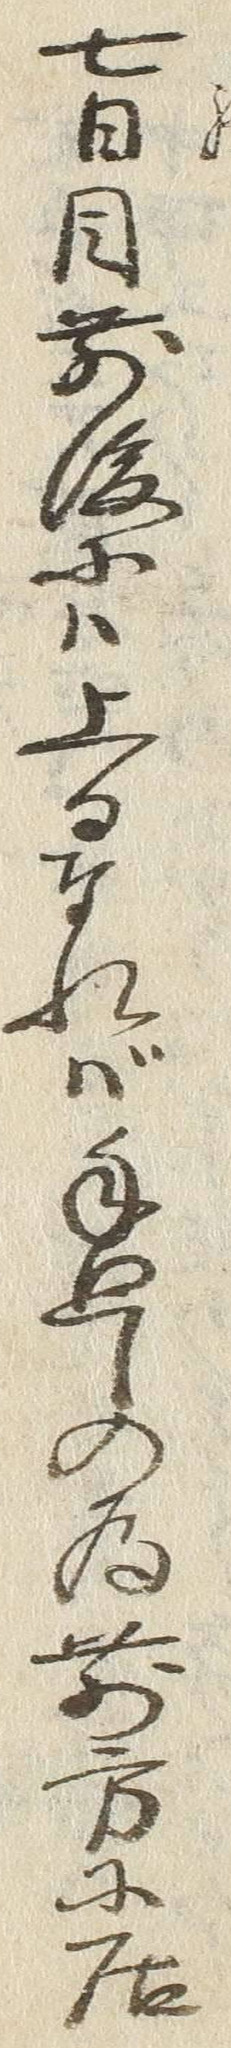七日目前後尓は上るなれば手回しの異為前方尓居
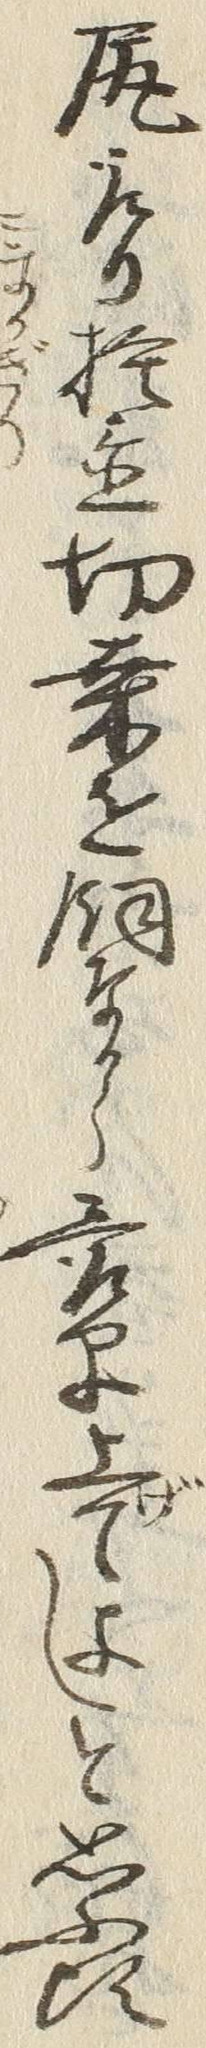尻取り捨置切桑を飼なから最早上げてよしと思ふ頃
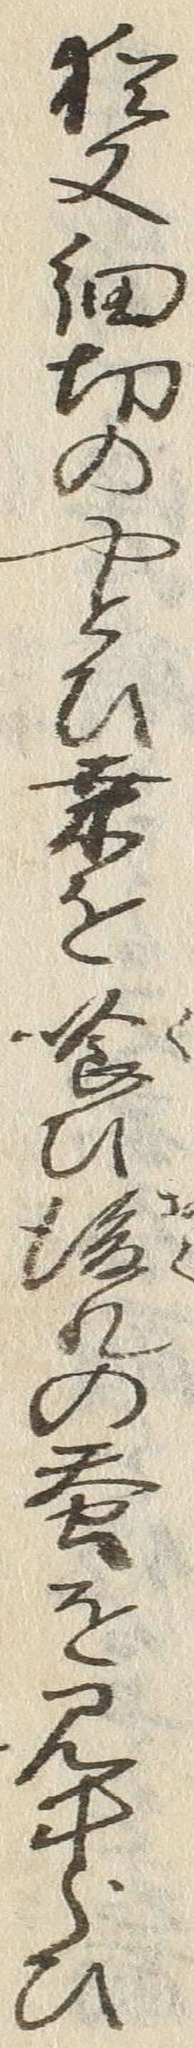猶又細切のやとひ桑を喰ひ後れの蚕を見斗らひ
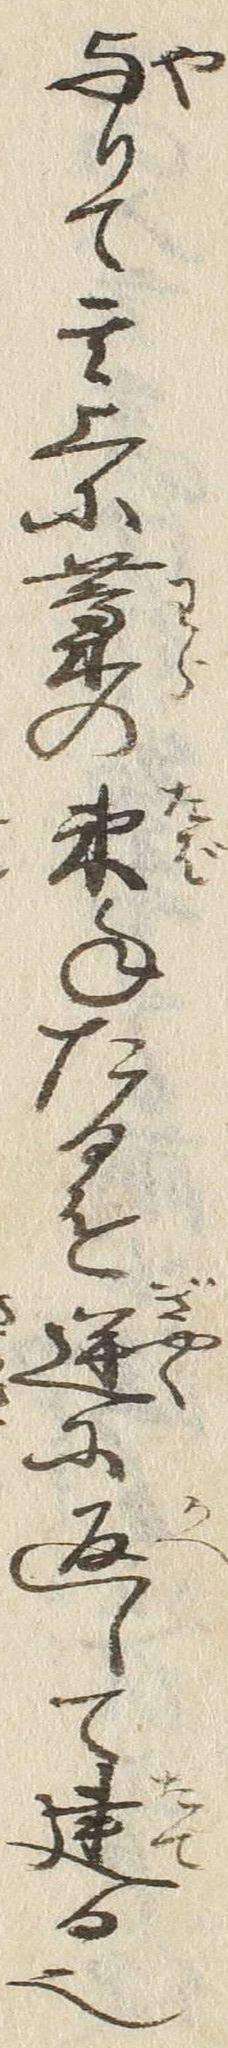与りて其上尓藁の束年たるを逆尓返して建る也
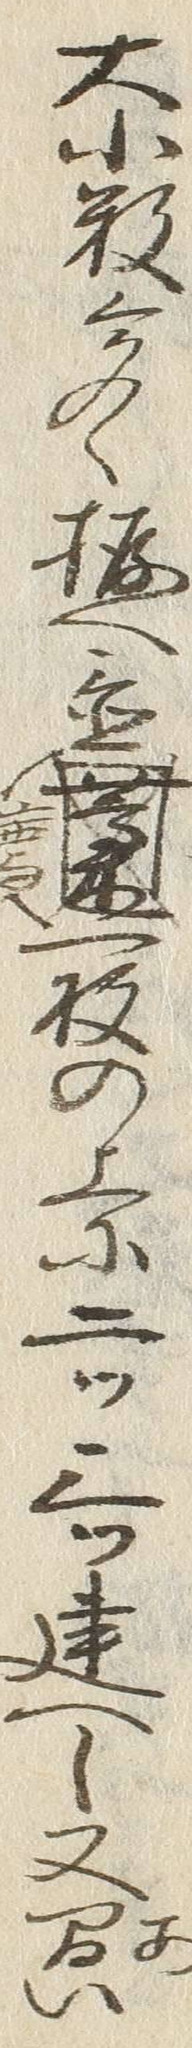大小数多く拵へ置薦一枚の上尓二ツ三ツ建へし又間い
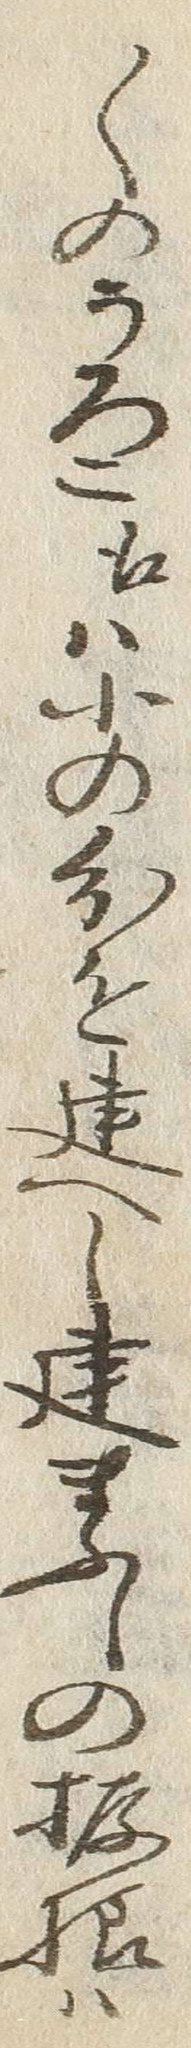〳〵のうろこ江は小の分を建へし建まふしの拵様は
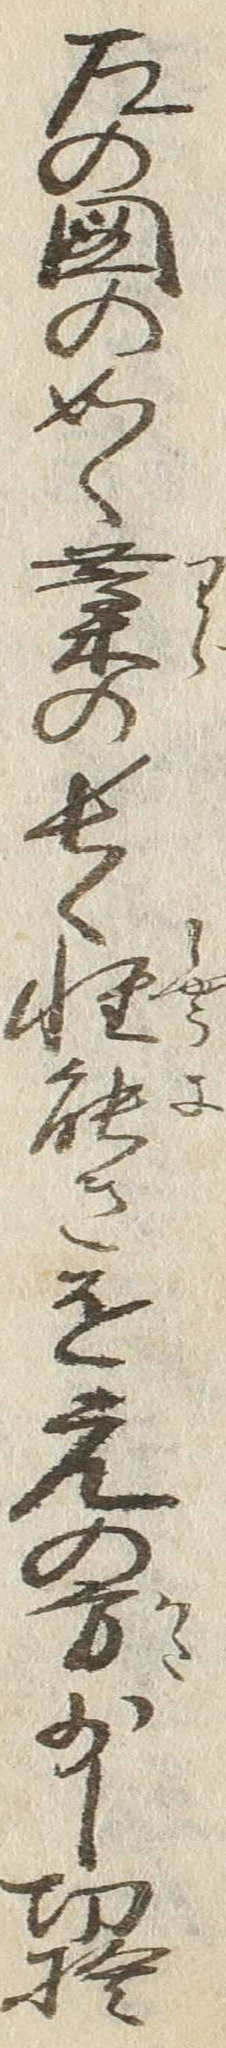左の図の如く藁の長く性能きを元の方少し切捨
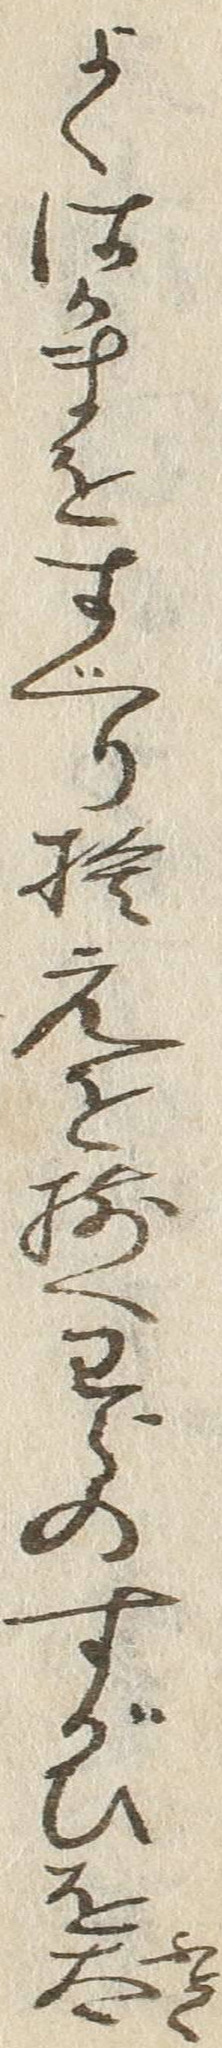よくはかまをすぐり捨元を揃へわらのすがひを太
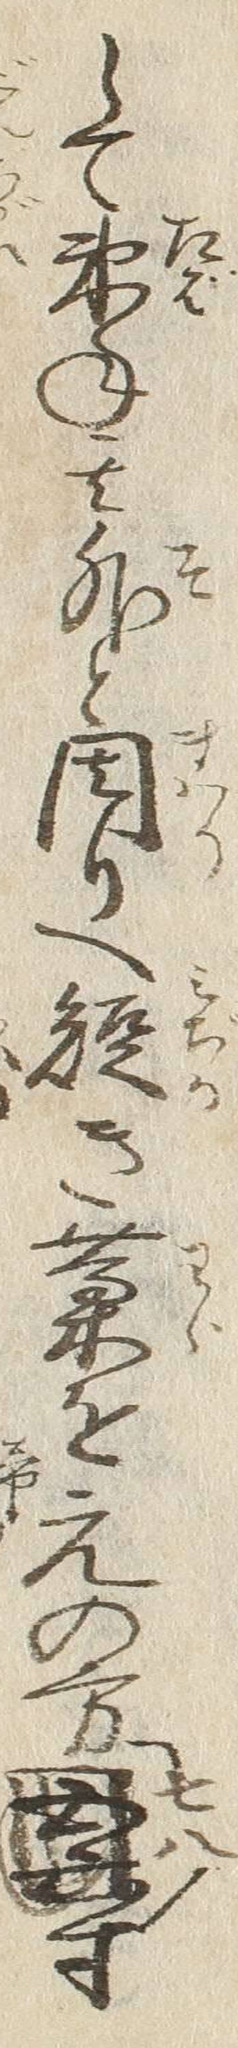して束年其外と周りへ短き藁を元の方七八寸
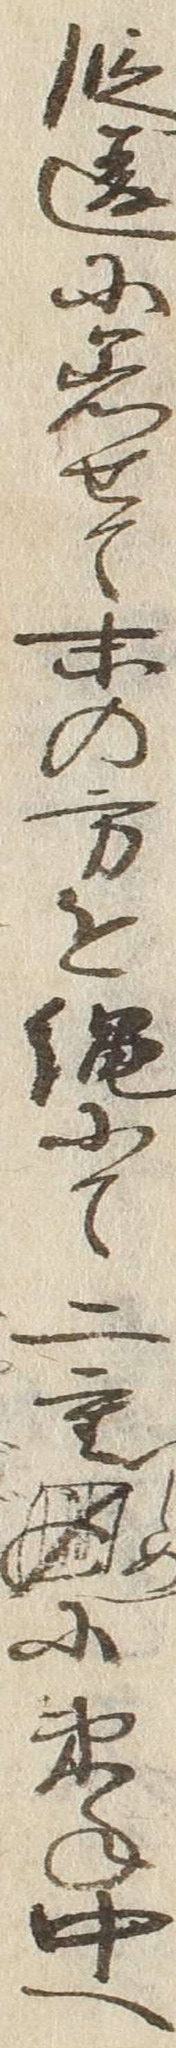段違尓着せて末の方を縄尓て二重締尓束年中へ
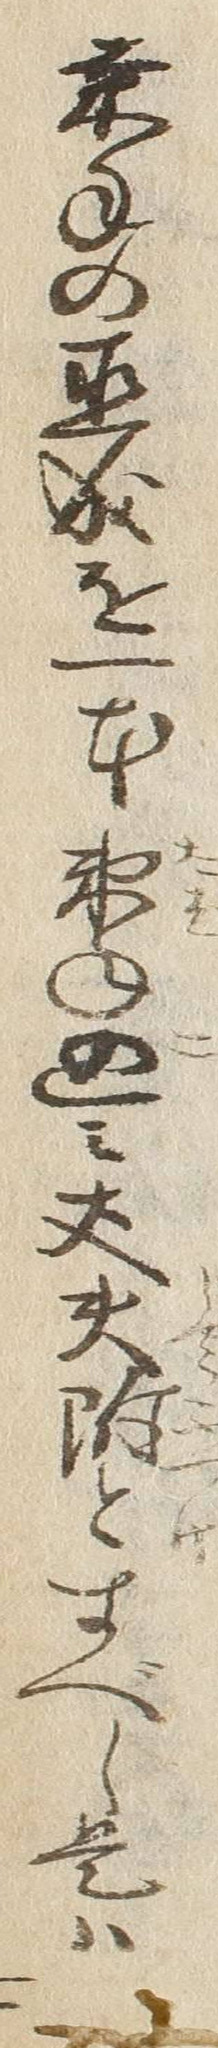桑手の直成を一本束年込み丈夫附とすべし是は
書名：養蠶實驗録後編
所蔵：東京大学農学生命科学図書館 国文学研究資料館
